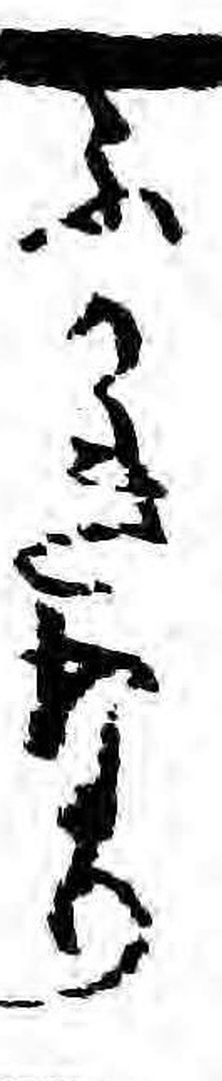ふかきなり
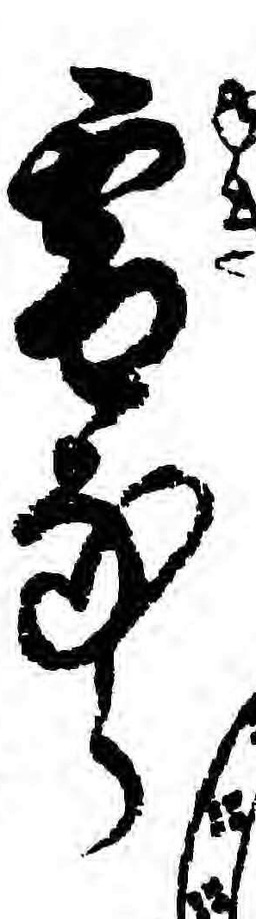雪なら
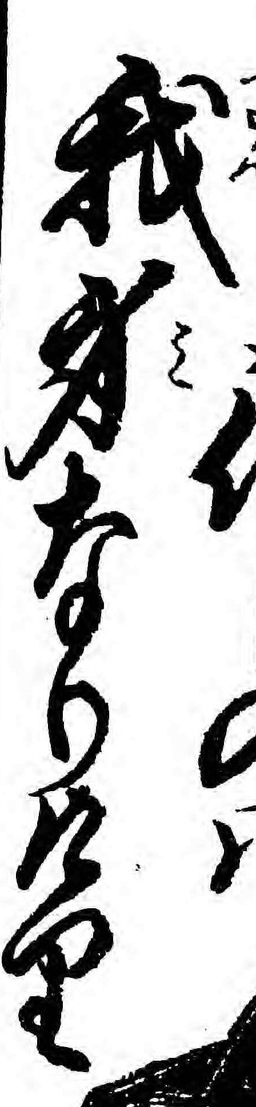我身なりけり
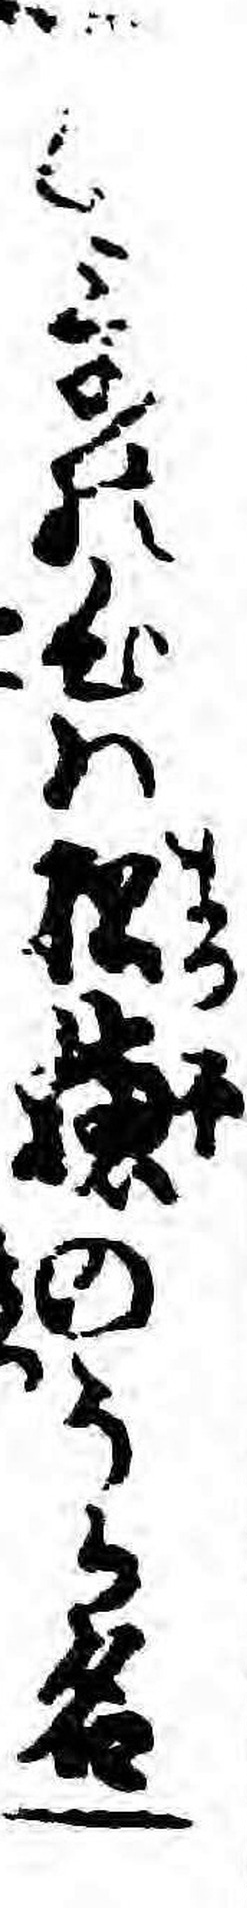此哥の心は松穂のうら名
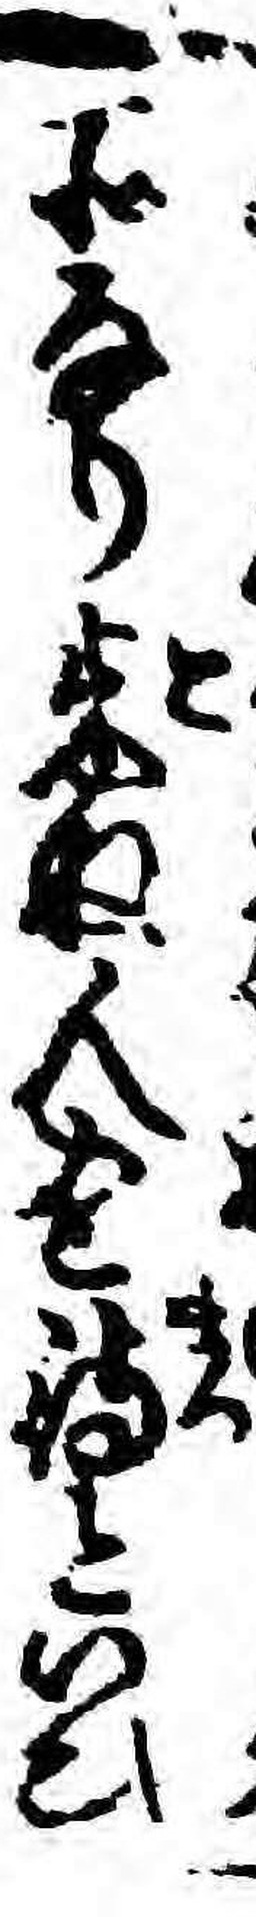所なり来ぬ人を待といひ
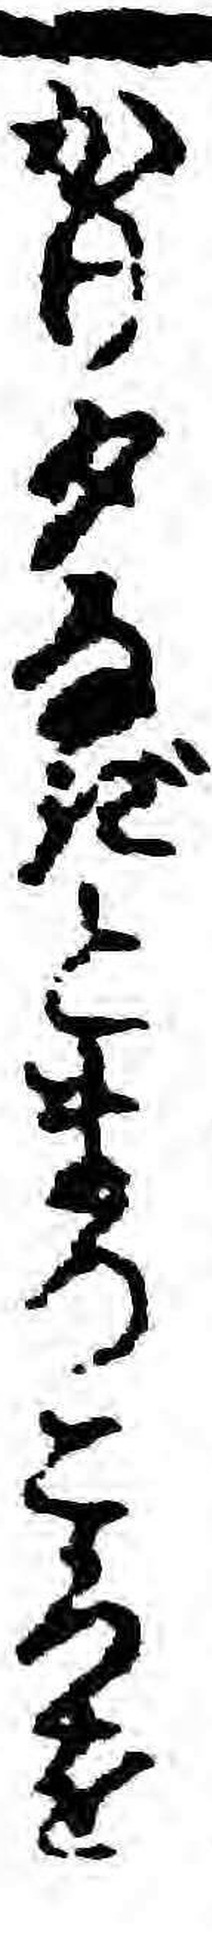かけ夕なぎだとまつころを
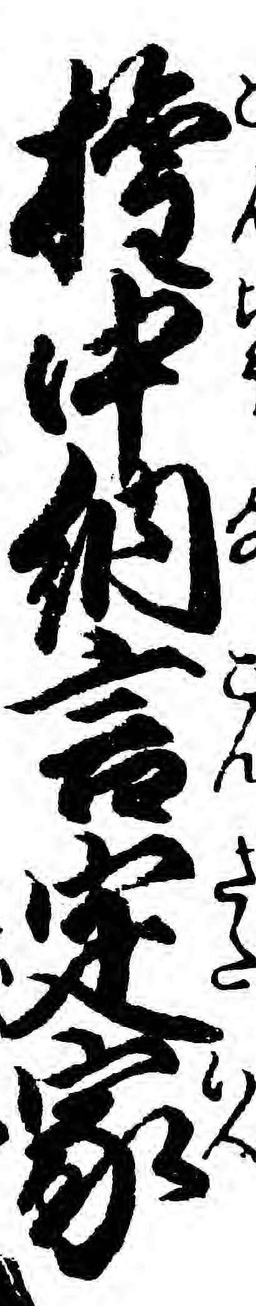権中納言定家
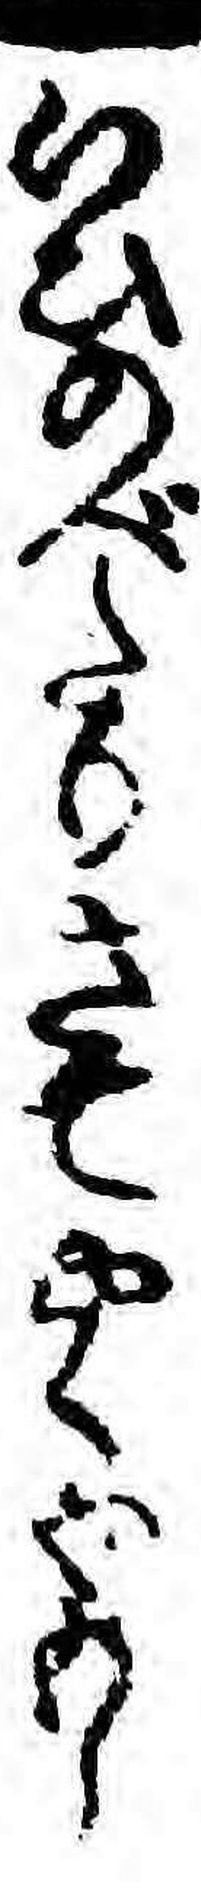いひのべたりさてやくやもし
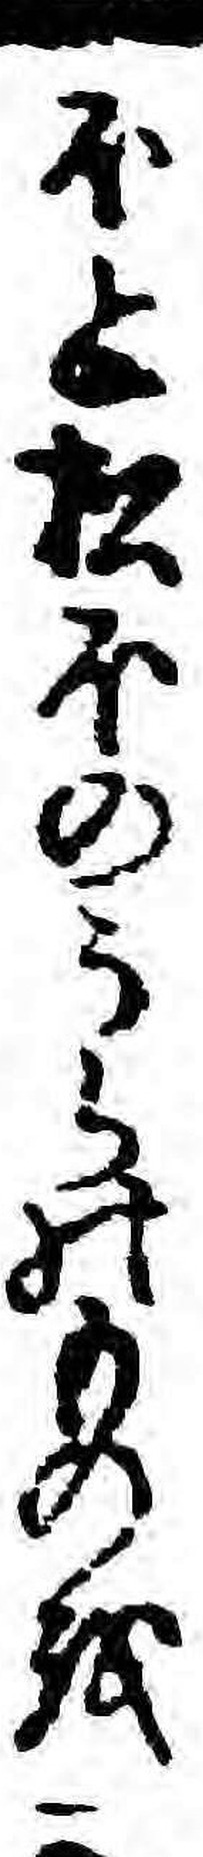ほと松ほのうらのものを
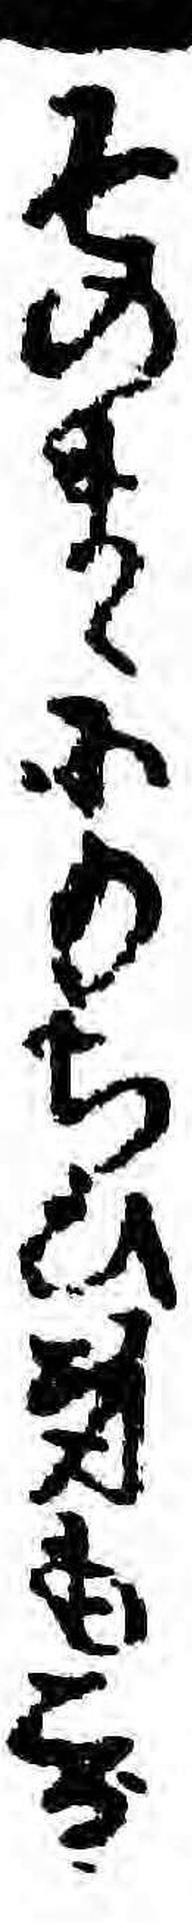そのまゝにもちひ身もこが
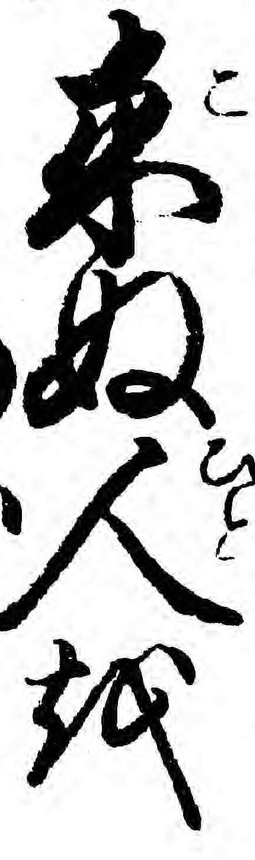来ぬ人を
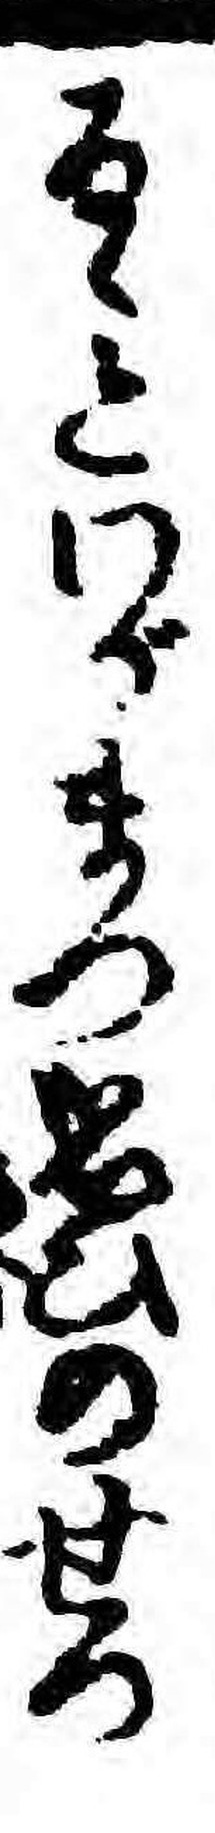るゝとわがまつ思ひのせつ
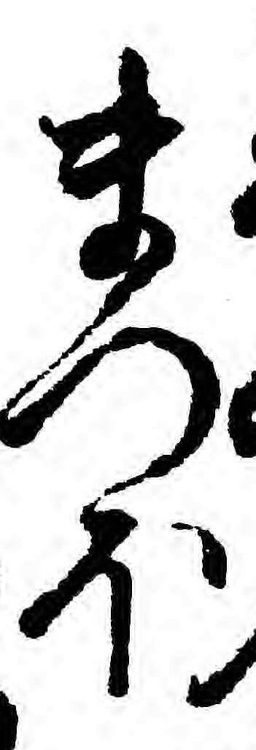まつほ
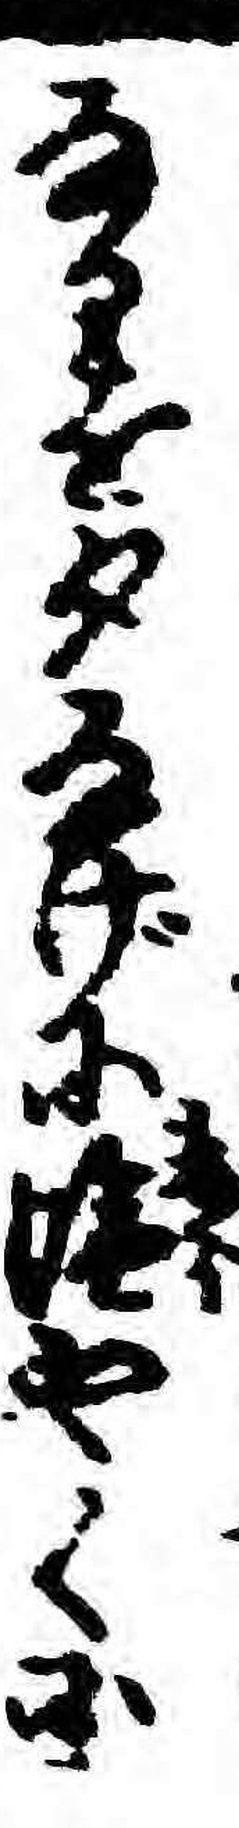なるを夕なげに塩やくに
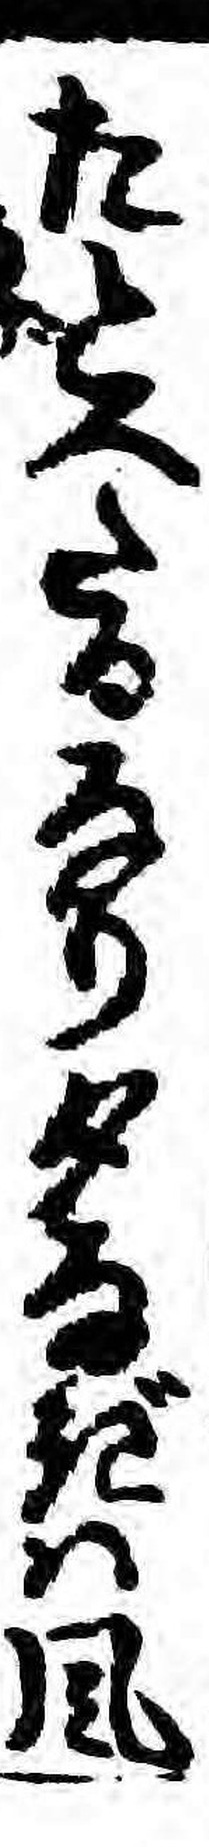たとへたるなり夕なぎは風
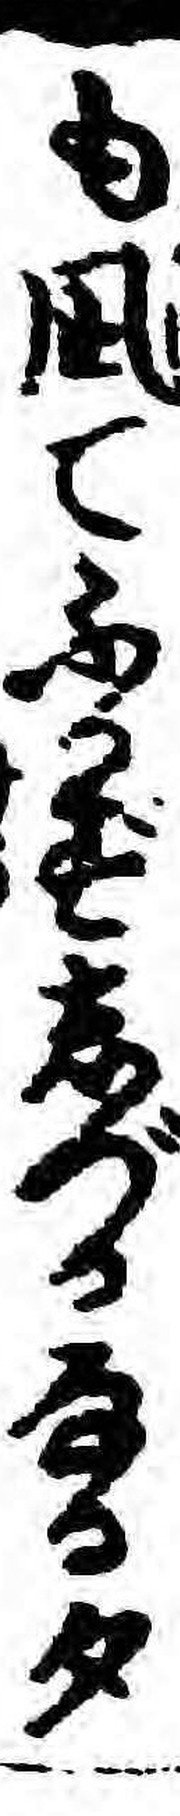も凪てふかずしづかなる夕
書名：頭書和歌注譯／壽賀多百人一首小倉錦
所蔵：国文学研究資料館
